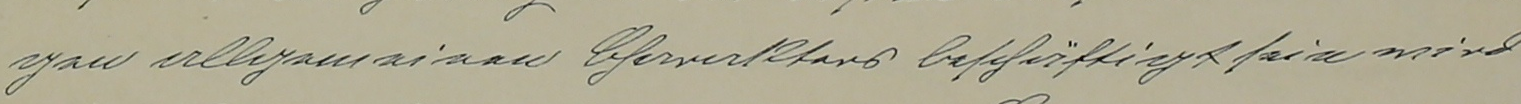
gen allgemeinen Charakters beschäftigt sein wird
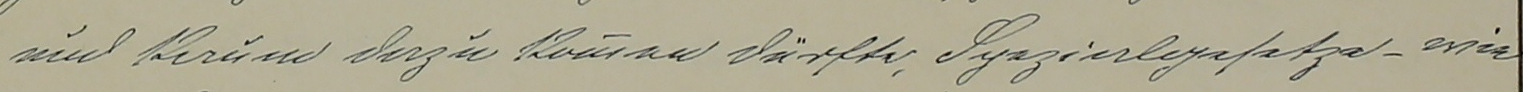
und kaum dazu kommen dürfte, Spezialgesetze - wie
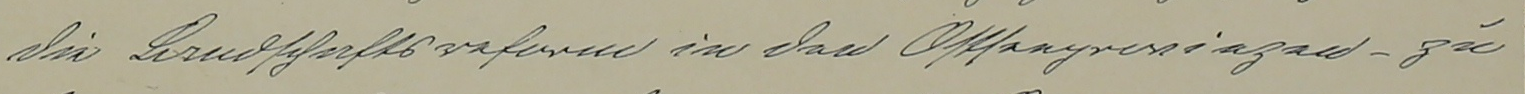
die Landschaftsreform in den Ostseeprovinzen - zu
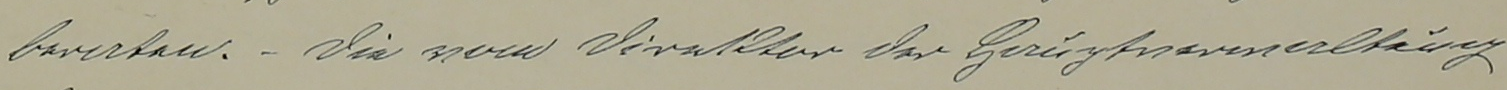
beraten. – Die vom Direktor der Hauptverwaltung
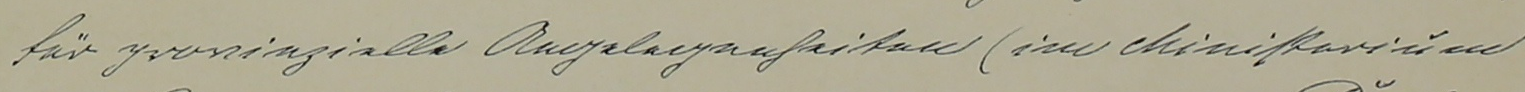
für provinzielle Angelegenheiten (im Ministerium
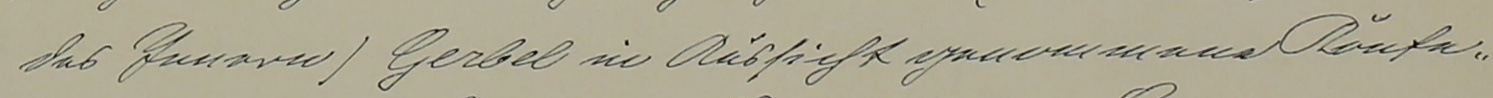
des Innern) Gerbel in Aussicht genommene Konfe-
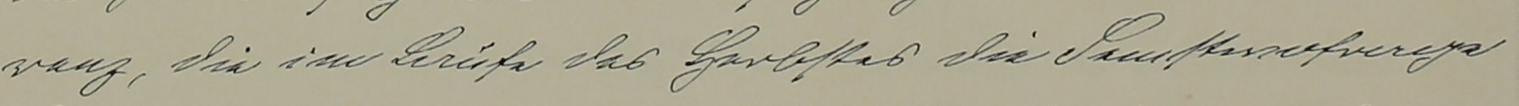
renz, die im Laufe des Herbstes die Semstwofrage
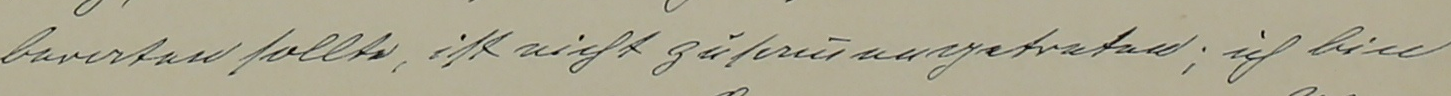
beraten sollte, ist nicht zusammengetreten; ich bin
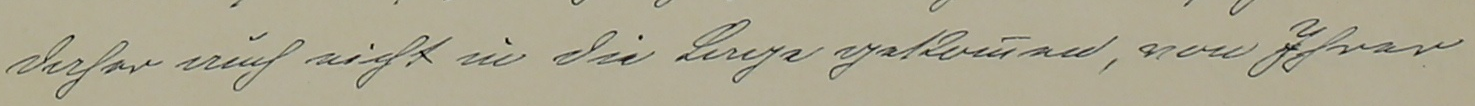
daher auch nicht in die Lage gekommen, von Ihrer
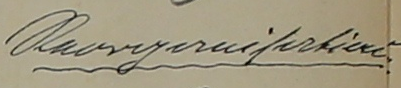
Reorganisation
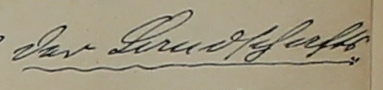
der Landschafts-
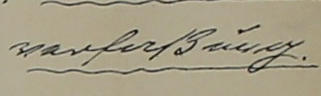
verfaßung
